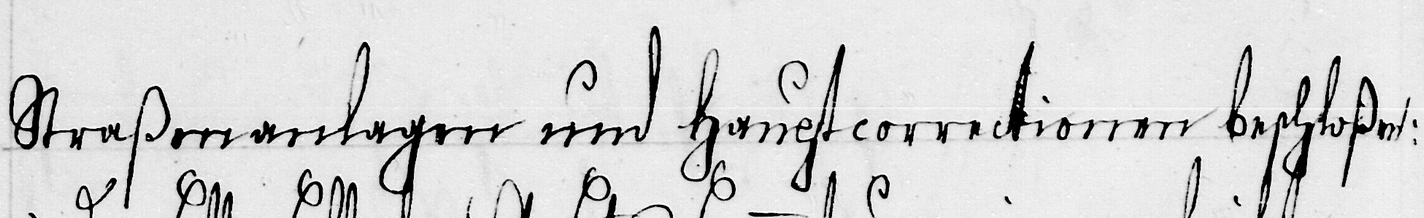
Straßenanlagen und Hauptcorrectionen beschloßen:
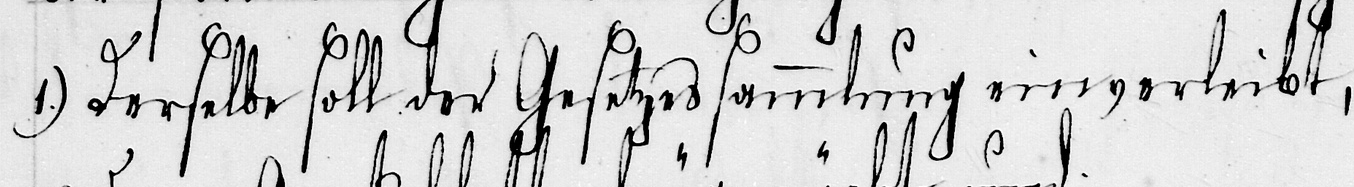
1.) Derselbe soll der Gesetzessammlung einverleibt,
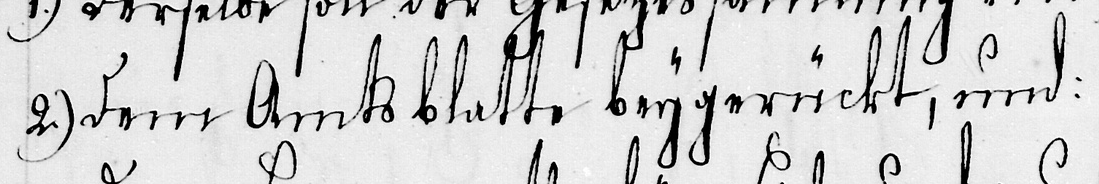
2.) Dem Amtsblatte beygerückt, und:
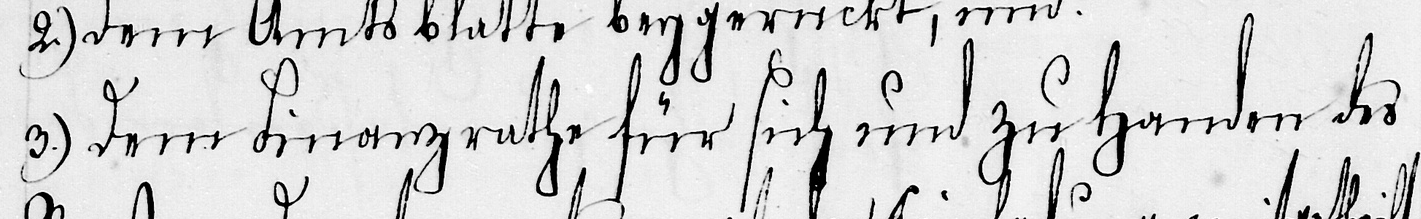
3.) Dem Finanzrathe für sich und zu Handen des
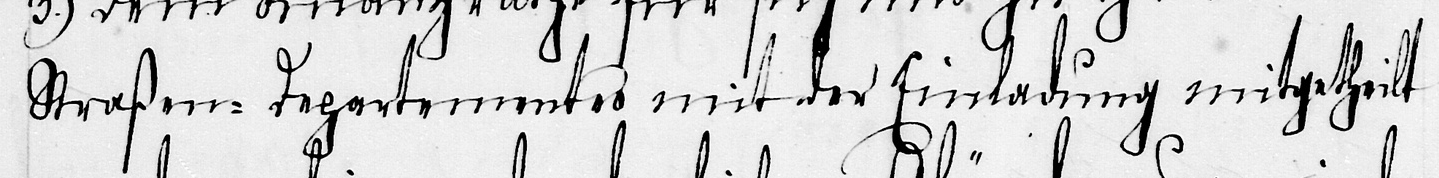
Straßen-Departementes mit der Einladung mitgetheilt
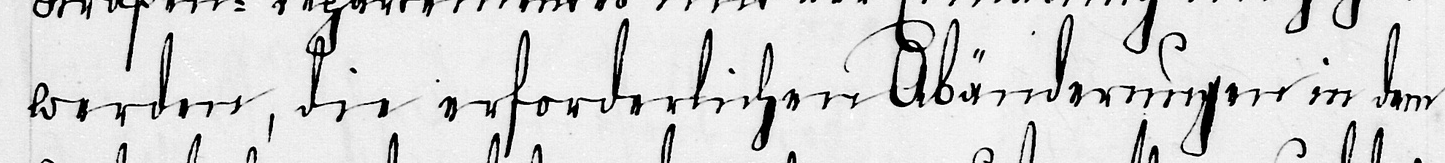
werden, die erforderlichen Abänderungen in dem
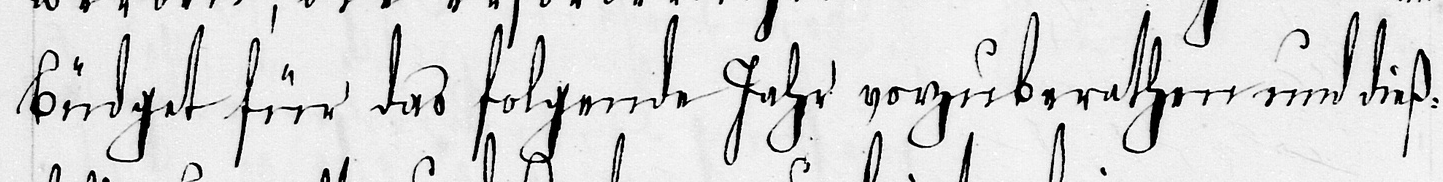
Büdget für das folgende Jahr vorzuberathen und die¬
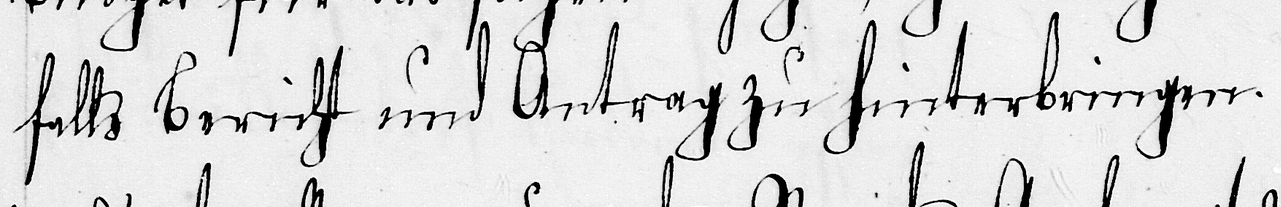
falls Bericht und Antrag zu hinterbringen.
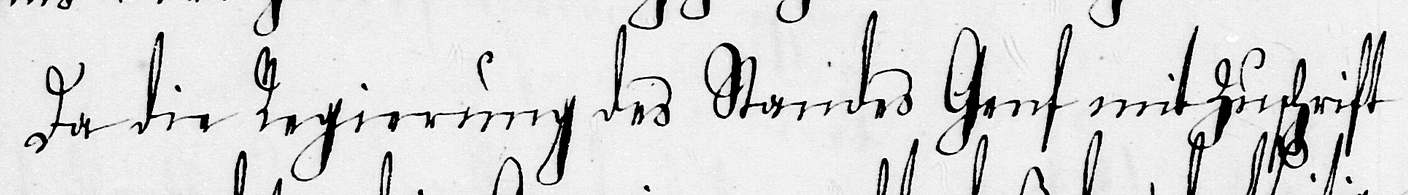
Da die Regierung des Standes Genf mit Zuschrift
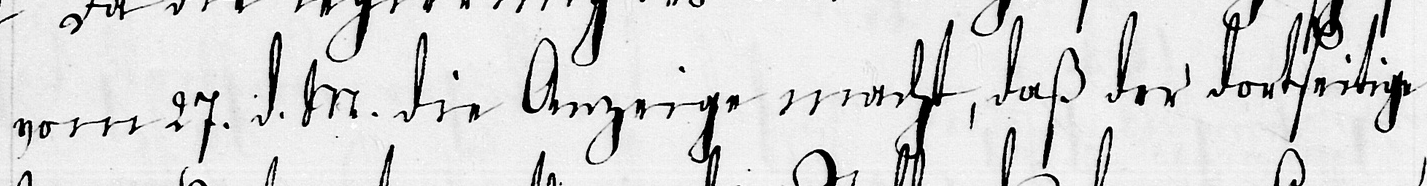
vom 27. d. M. die Anzeige macht, daß der dortseitige
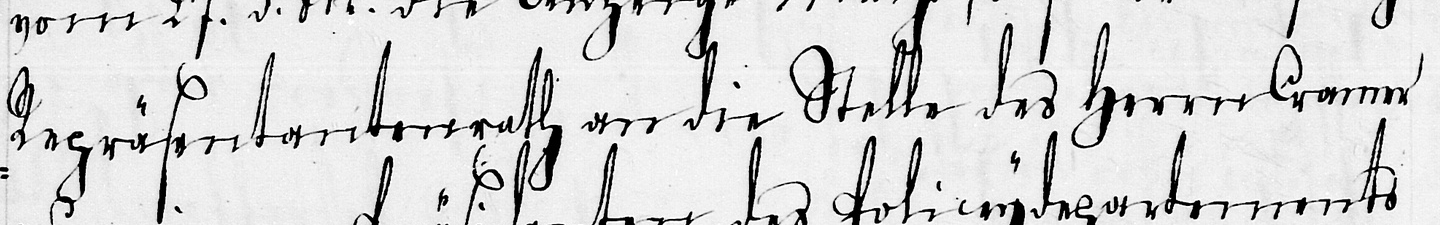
Repräsentantenrath an die Stelle des Herrn Cramer
